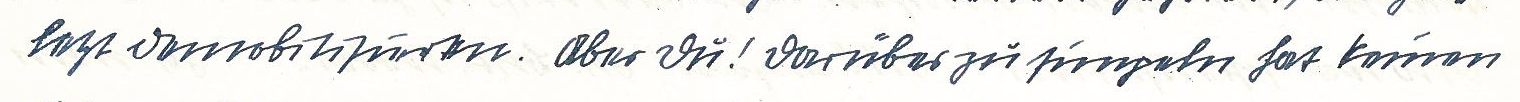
letzt demobilisierten. Aber Du! Darüber zu simpeln hat keinen
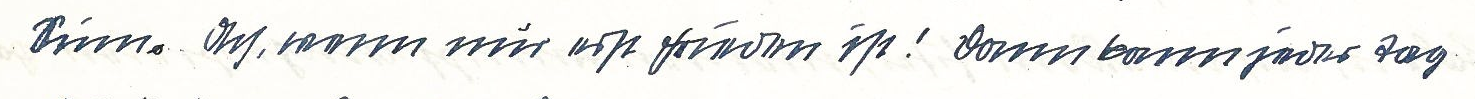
Sinn. Ach, wenn nur erst Frieden ist! Dann kann jeder Tag
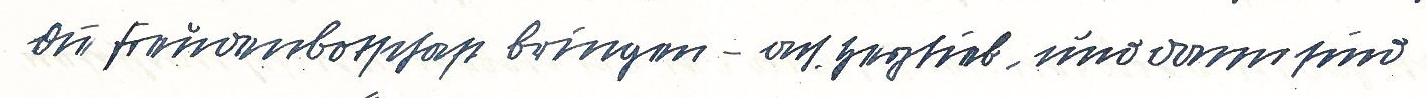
die Freudenbotschaft bringen – ach Herzlieb, und dann sind
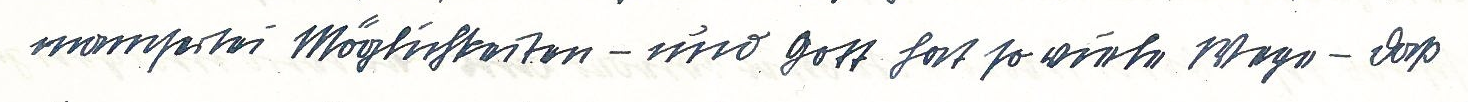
mancherlei Möglichkeiten – und Gott hat so viele Wege – daß
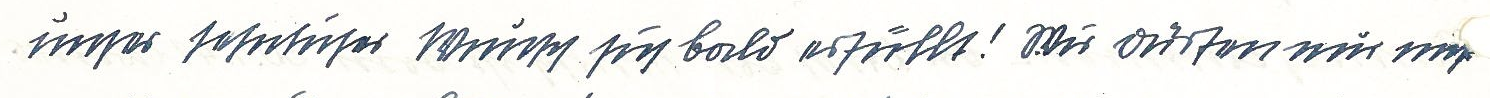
unser sehnlicher Wunsch sich bald erfüllt! Du erlebst nur
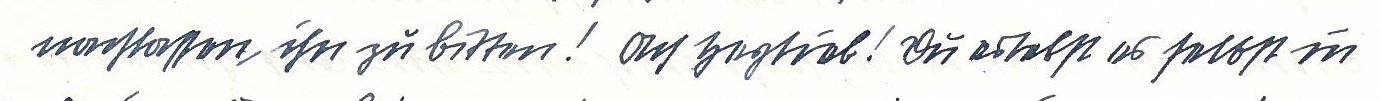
nachlassen, ihn zu bitten! Ach heztieb! Du erbebst es selbst in
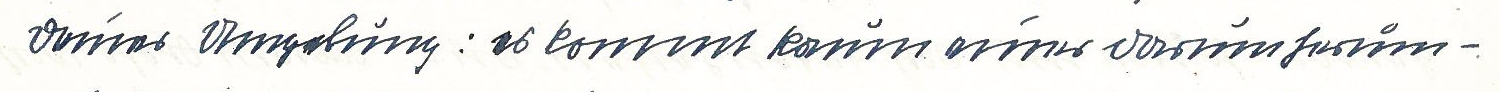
Deiner Umgebung: es kommt kaum einer darum herum –
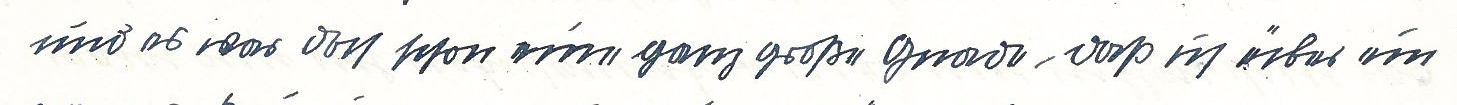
und es war schon eine große Gnade, daß ich über ein
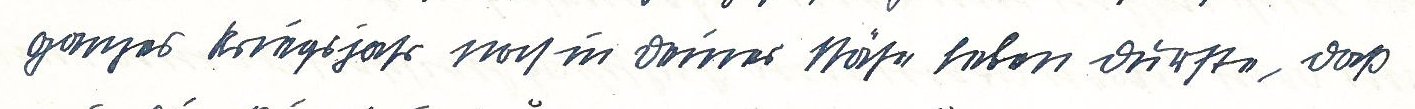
ganzes Kriegsjahr noch in Deiner Nähe leben durfte, daß
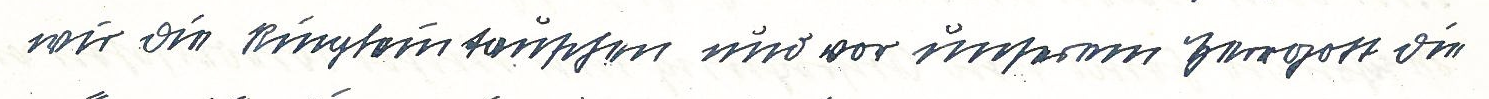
wir die Ringlein tauschen und vor unserem Herrgott die
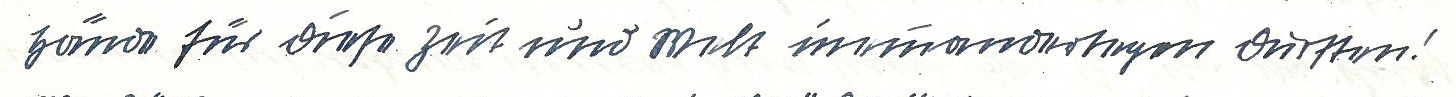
Hände für diese Zeit und Welt ineinanderlegen durften!
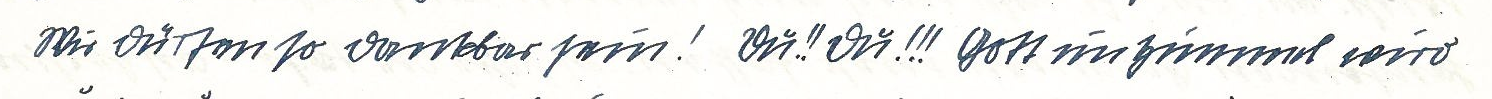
Wir dürfen so dankbar sein! Du!! Du!!! Gott im Himmel wird
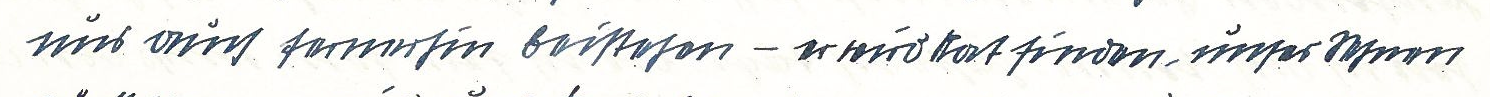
uns auch fernerhin beistehen – er wird Rat finden, unser Sehnen
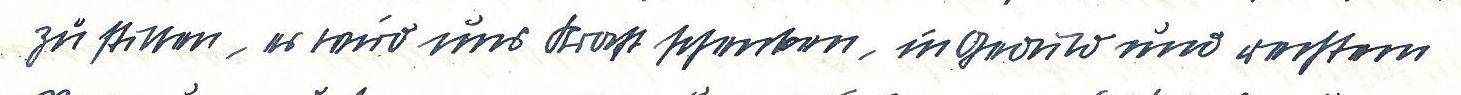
zu stillen, er wird auch Kraft schenken, in Geduld und rechtem
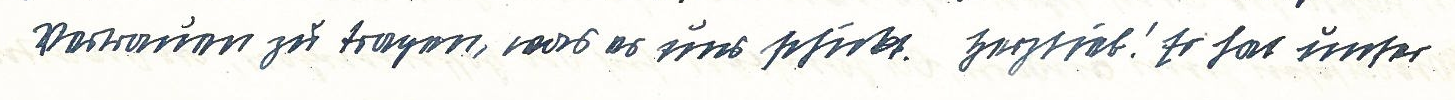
Vertrauen zu tragen, was er uns schickt. Herzlieb! Er hat unser
